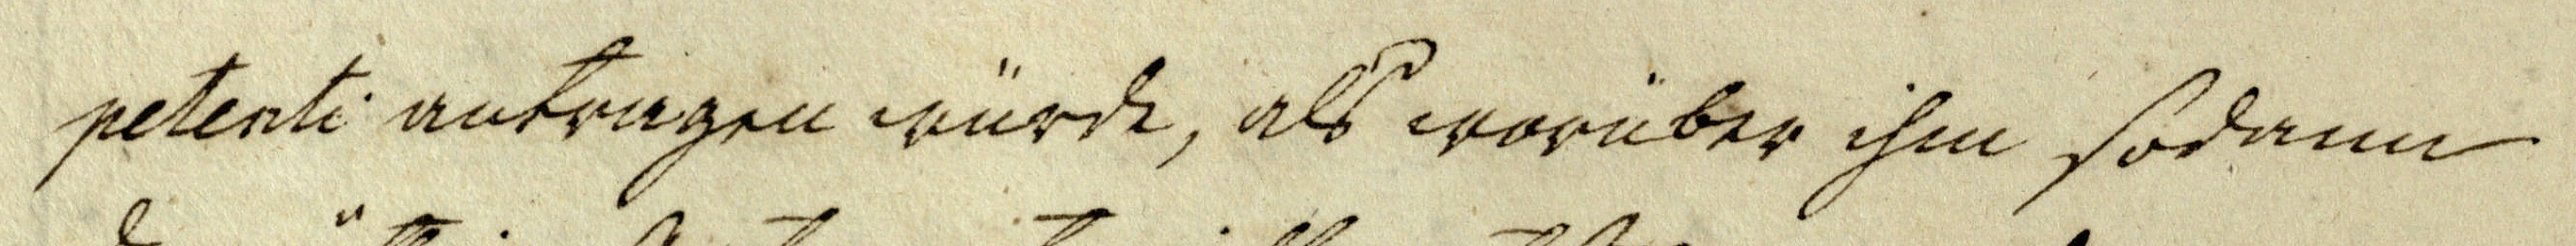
petenti antragen würde, als worüber ihm sodann
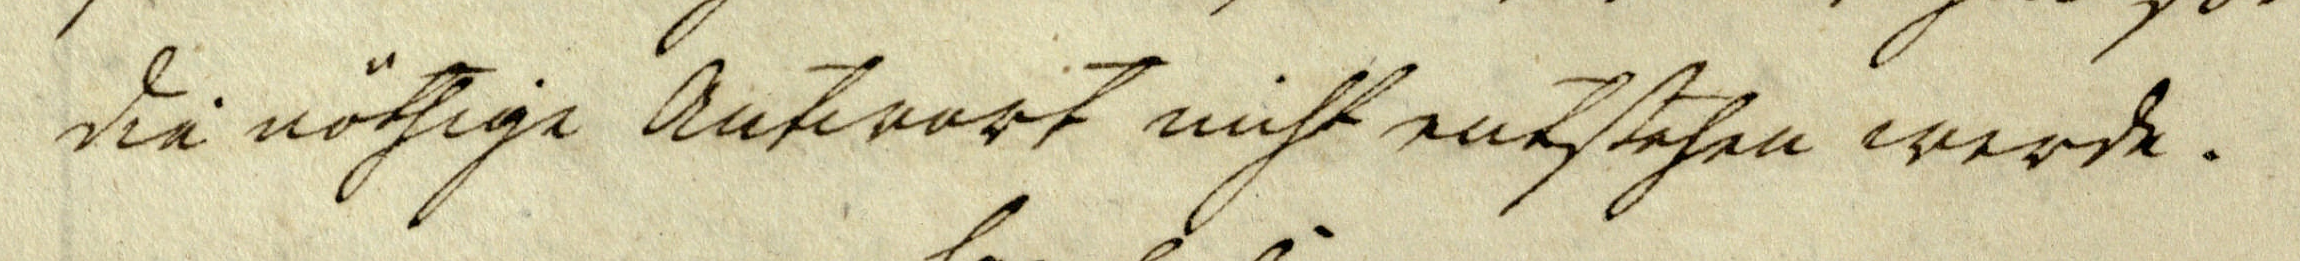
die nöthige Antwort nicht entstehen werde.
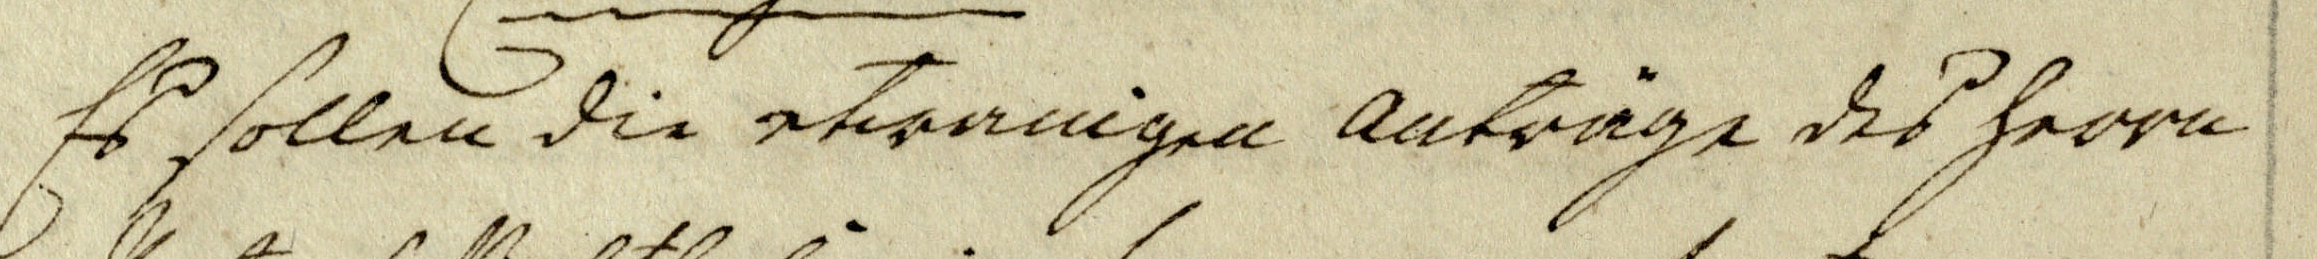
Es sollen die etwanigen Anträge des Herrn
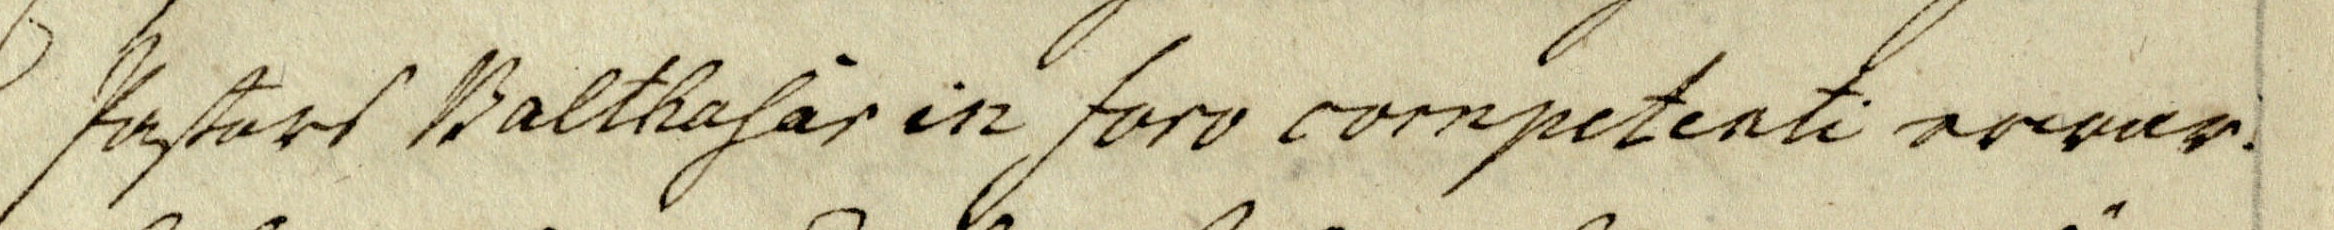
Pastors Balthasar in foro competenti erwar¬
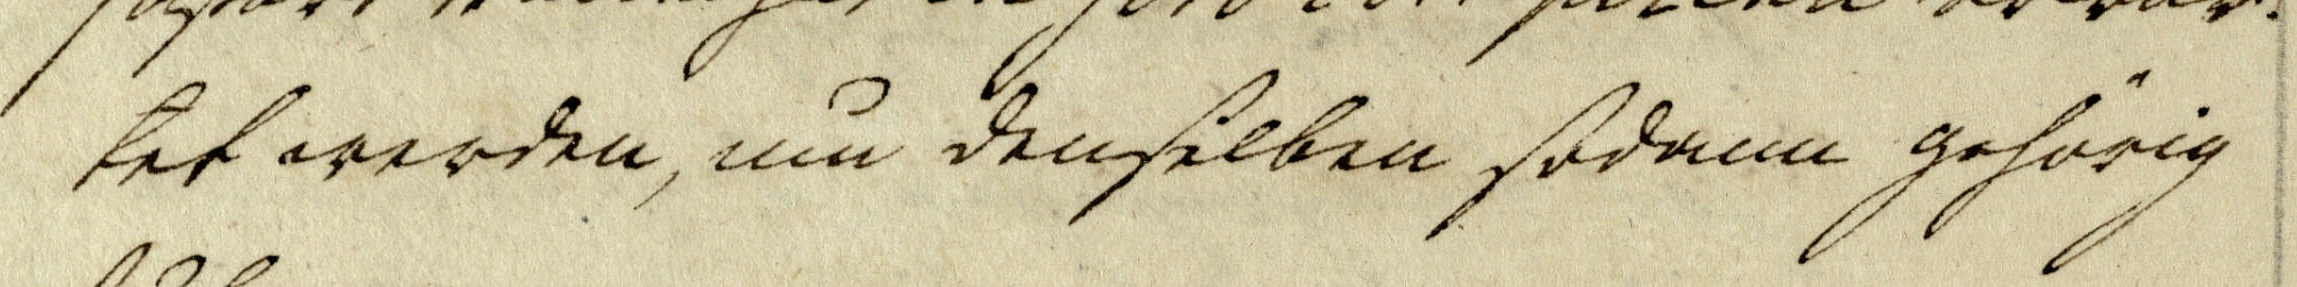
tet werden, um denselben sodann gehörig
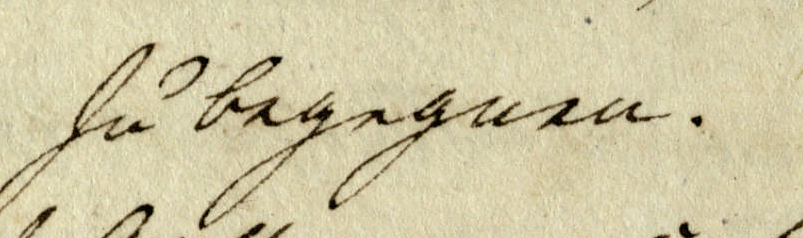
zu begegnen.
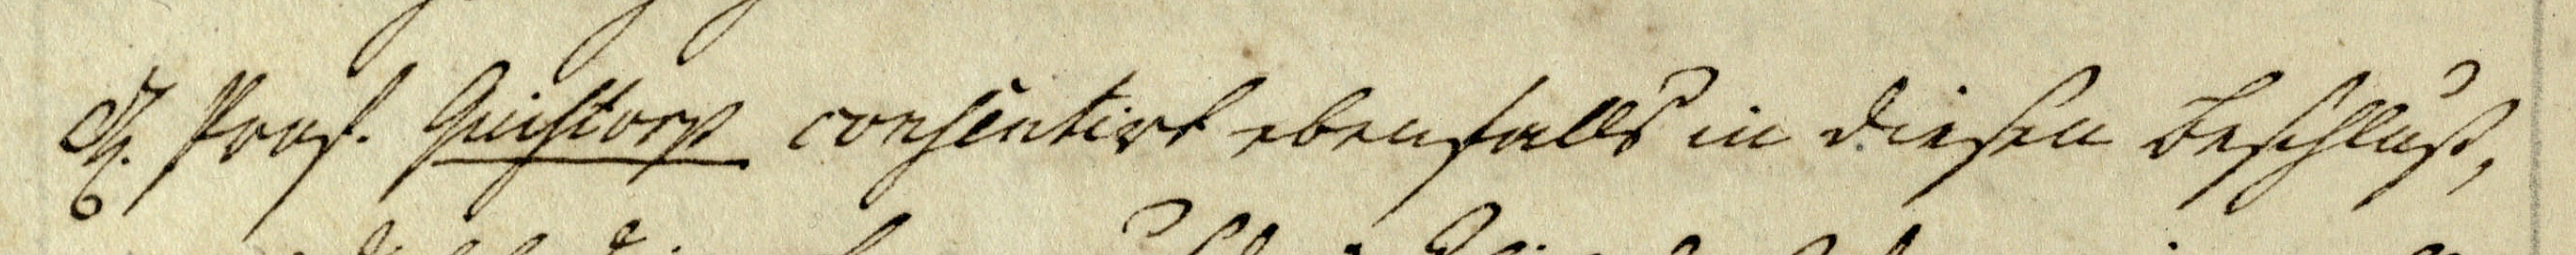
dh. Prof. Quistorp consentirt ebenfalls in diesen Beschluß,
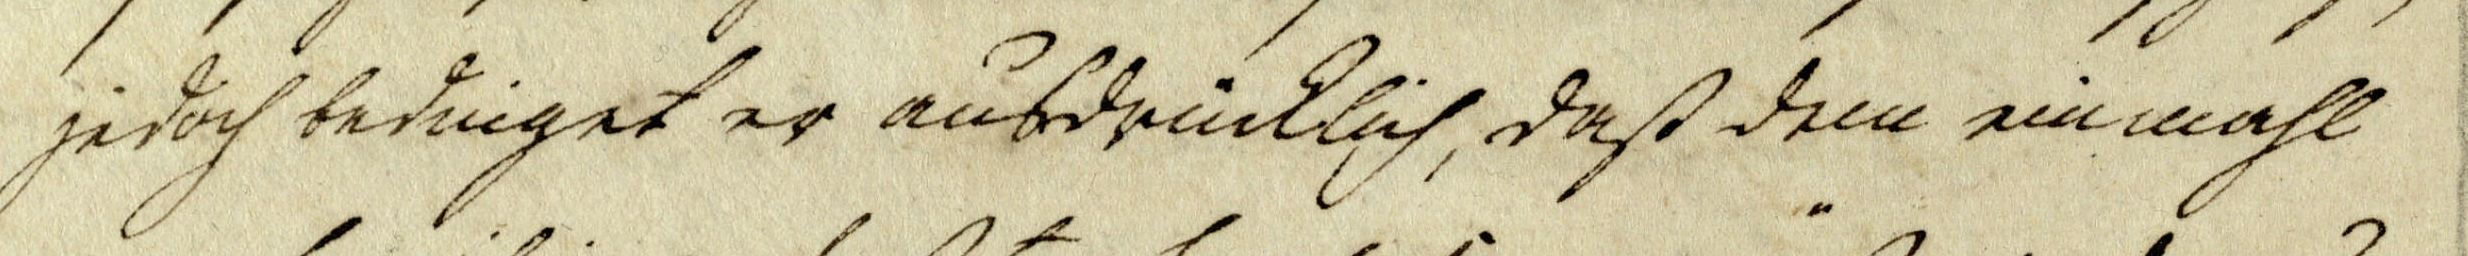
jedoch bedinget er ausdrücklich, daß dem einmahl
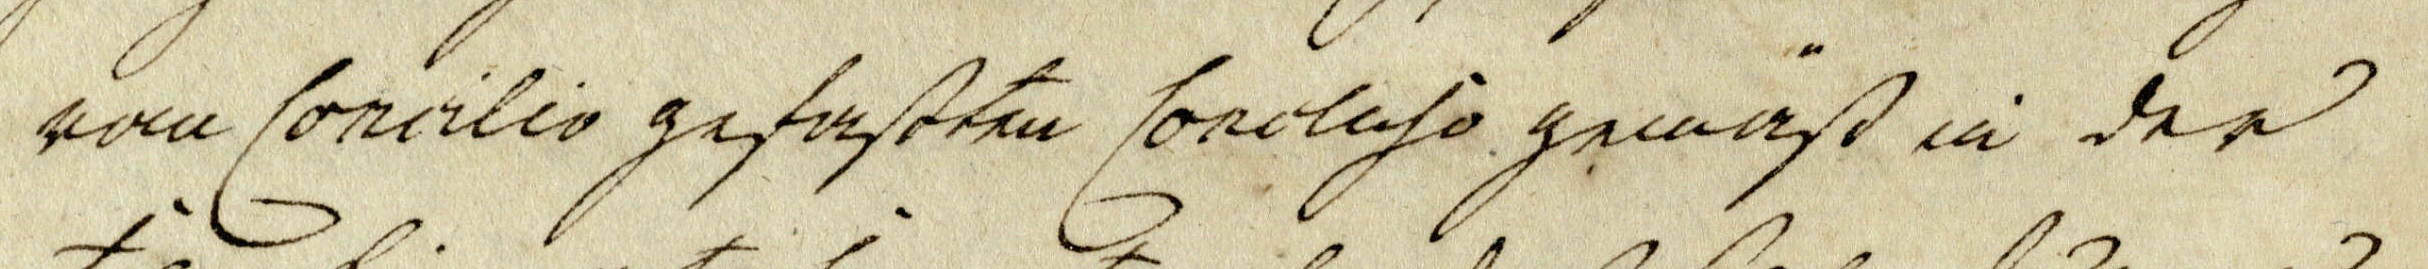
vom Concilio gefaßten Concluso gemäß in der
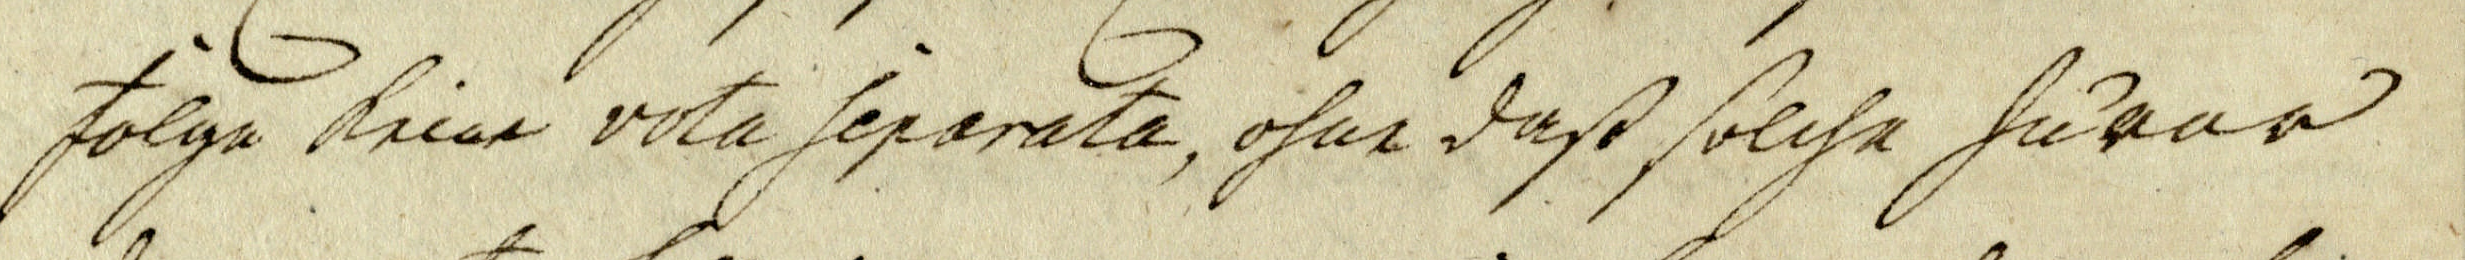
Folge keine vota separata, ohne daß solche zuvor
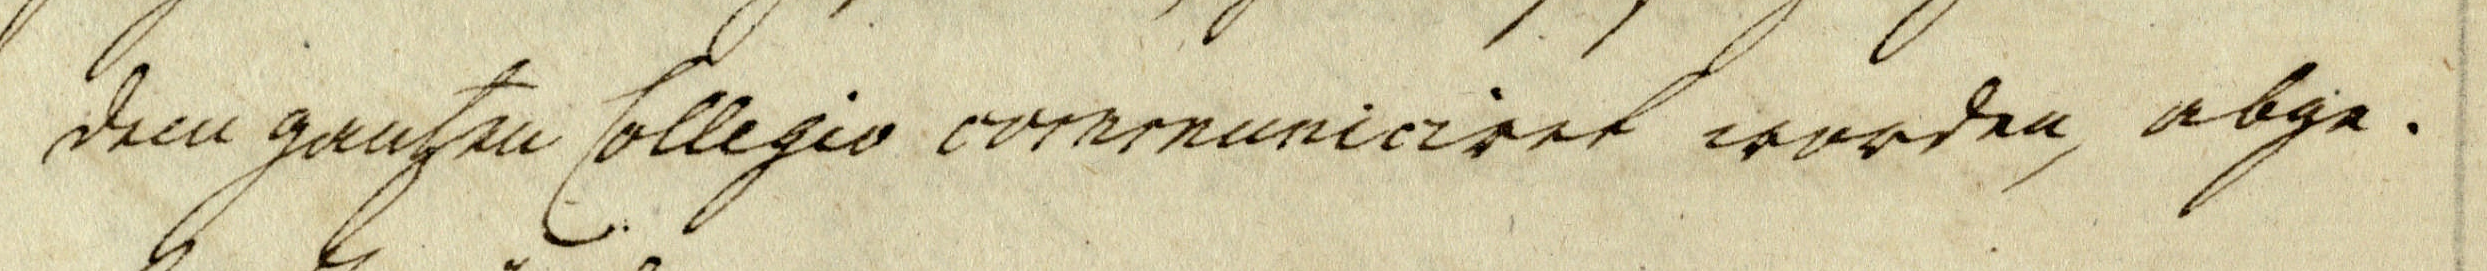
dem ganzen Collegio communiciret worden, abge¬
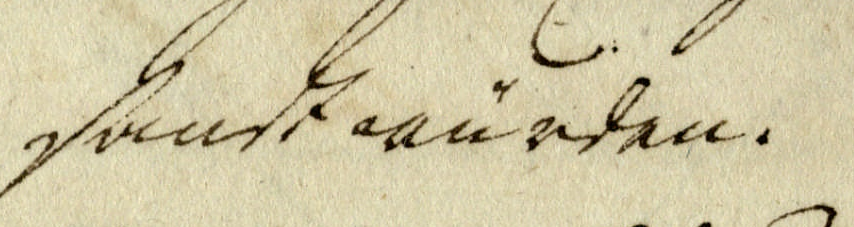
sandt würden.
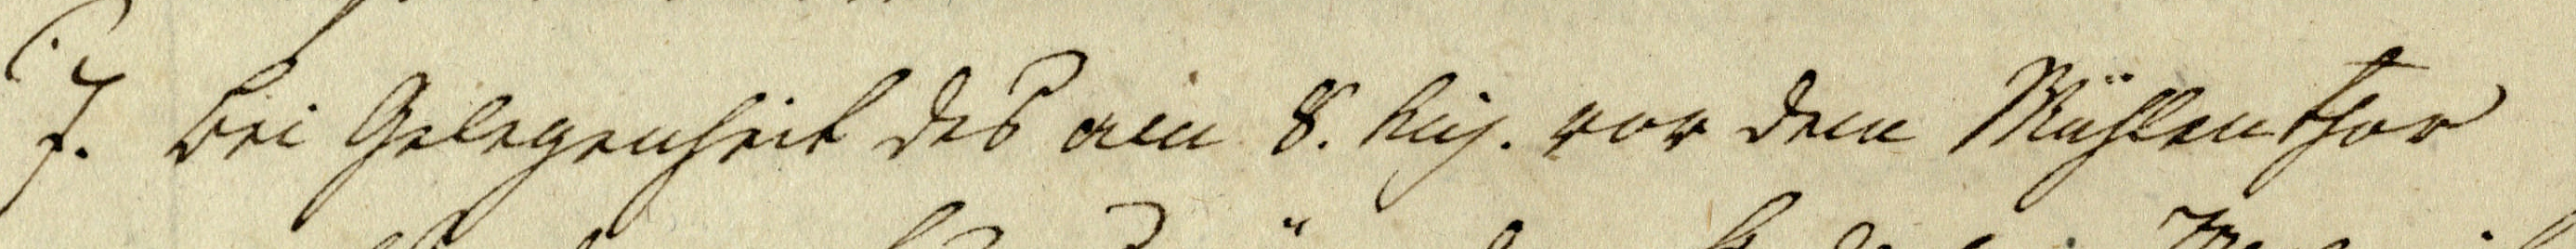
7. Bei Gelegenheit des am 8. huj. vor dem Mühlenthor
